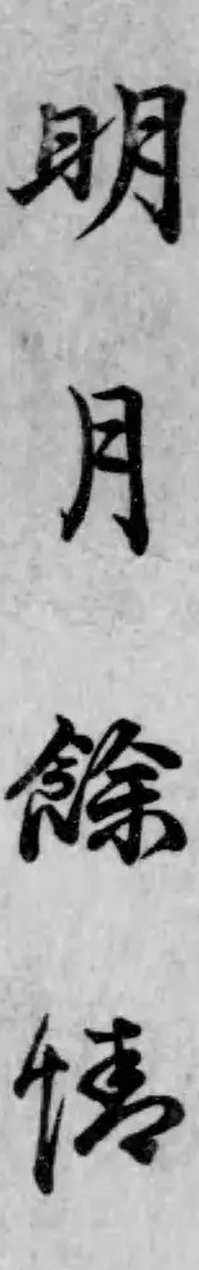明月余情

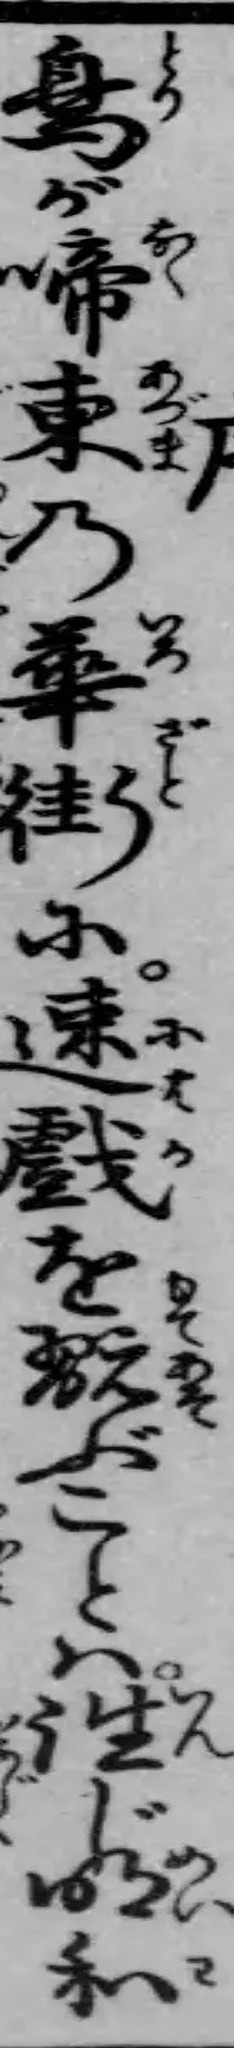鳥が啼東の華街に。速戯を翫ぶことは。往じ明和
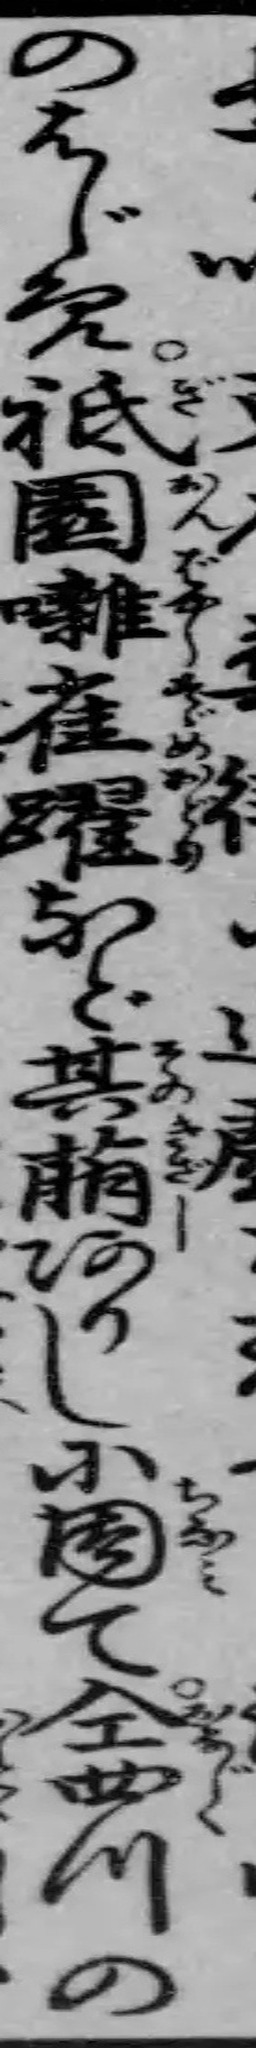のはじめ。祇園囃雀躍など其萌ありしに因て。同四つの
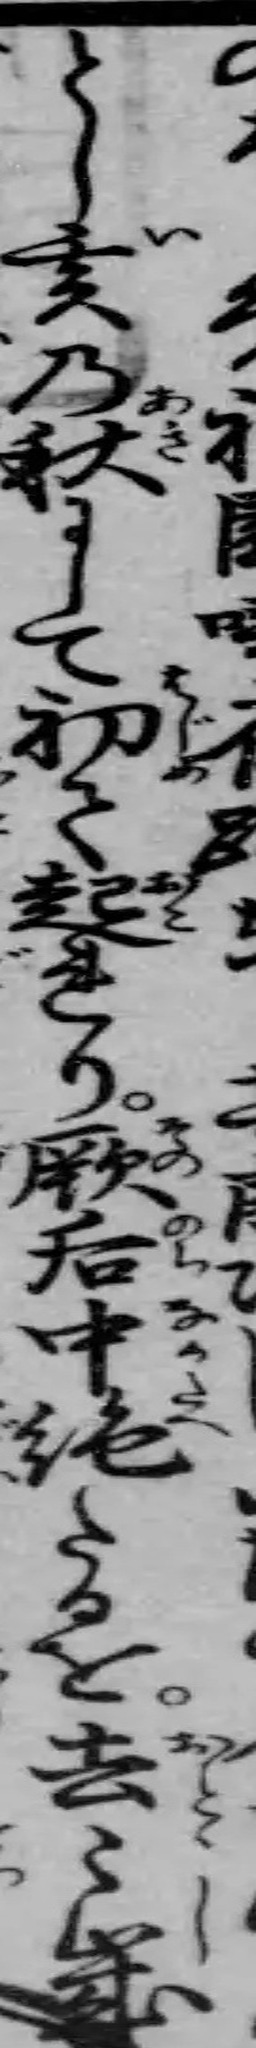とし亥の秋にして初て起れり。厥后中絶たるを。去々歳
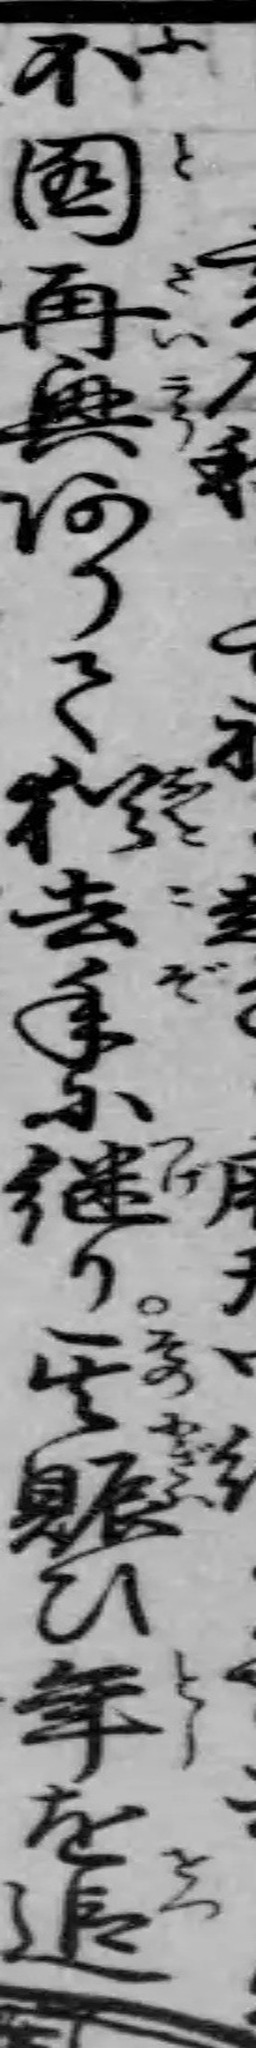不図再興ありて猶去年に継り。其賑ひ年を追
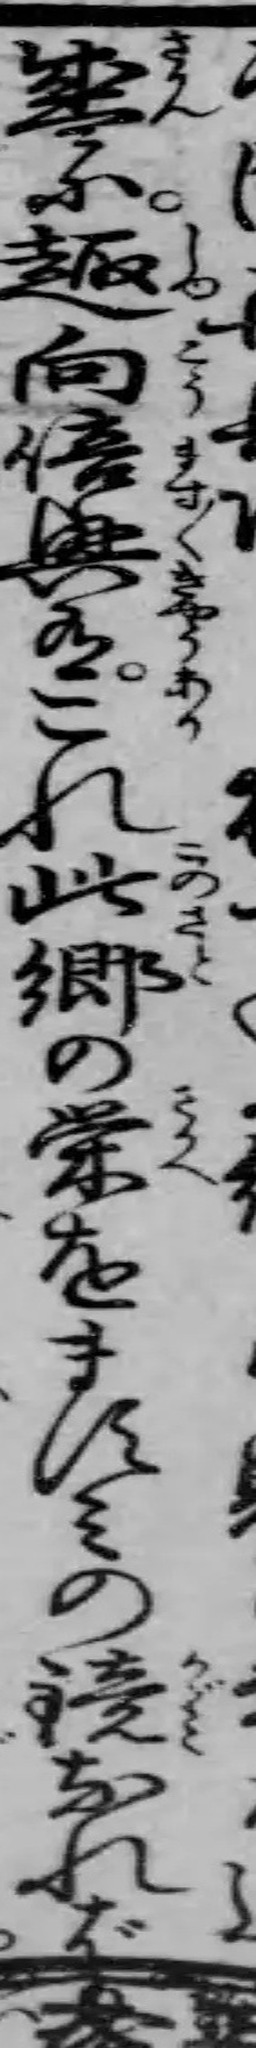盛に。趣向倍興有。これ此郷の栄をますみの鏡なれば。
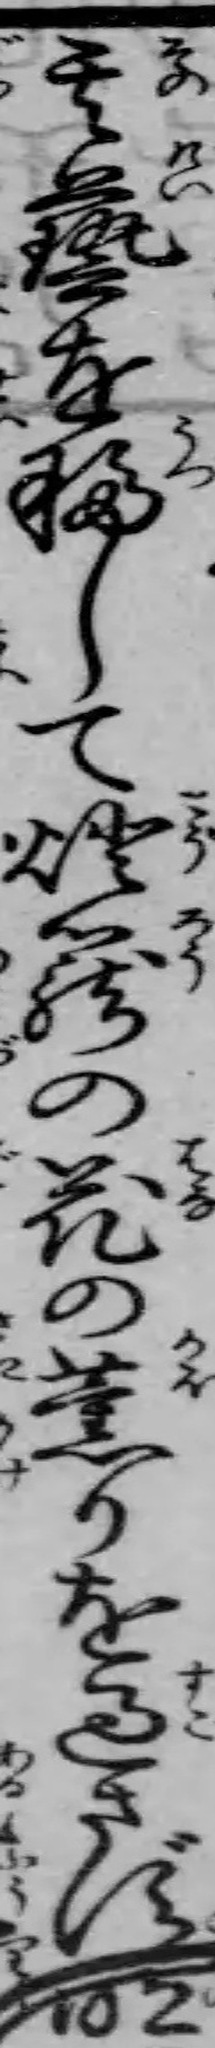其芸を移して燈籠の花の薫りを過さず明
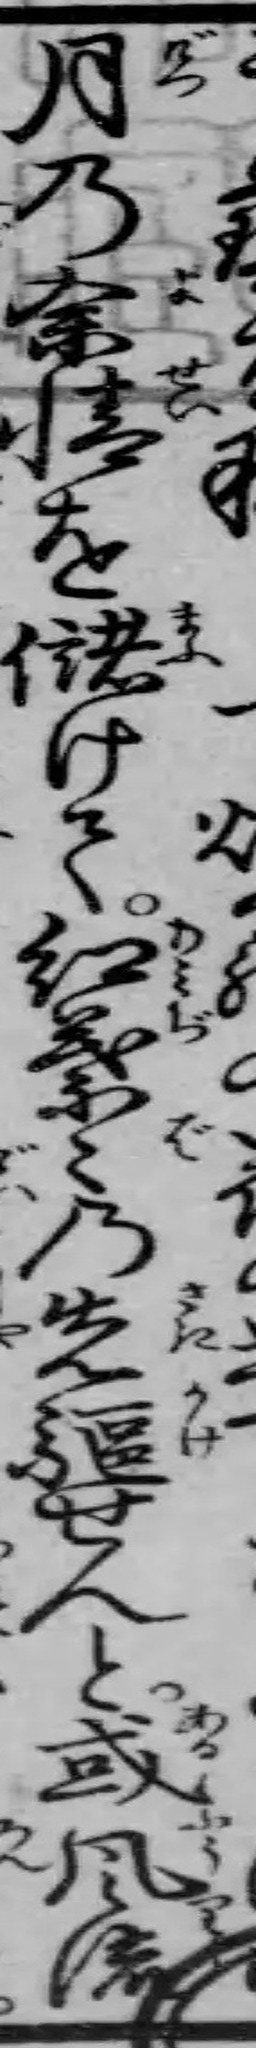月の余情を儲けて。紅葉々の先駆せんと。或風流
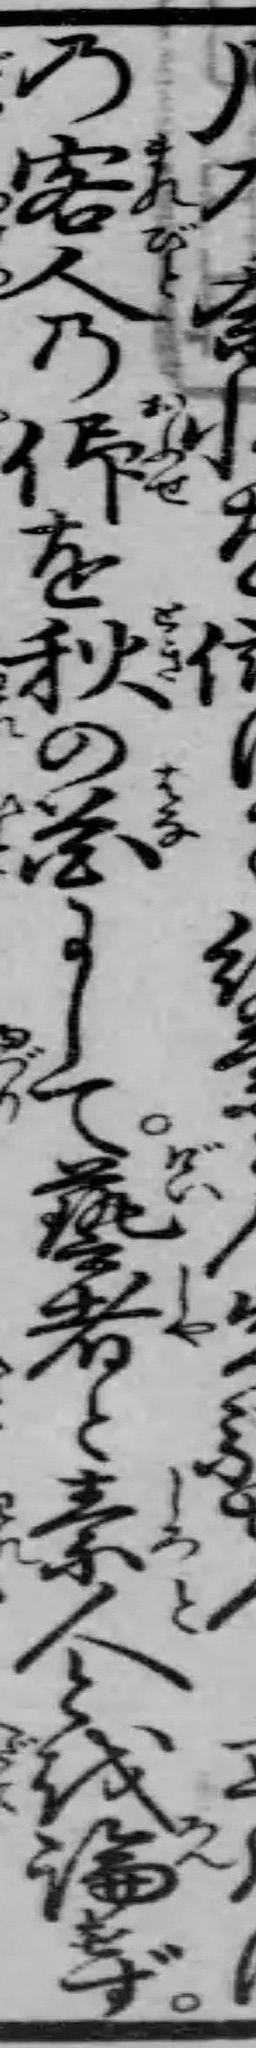の客人の仰を秋の花にして。芸者と素人とを論せず。
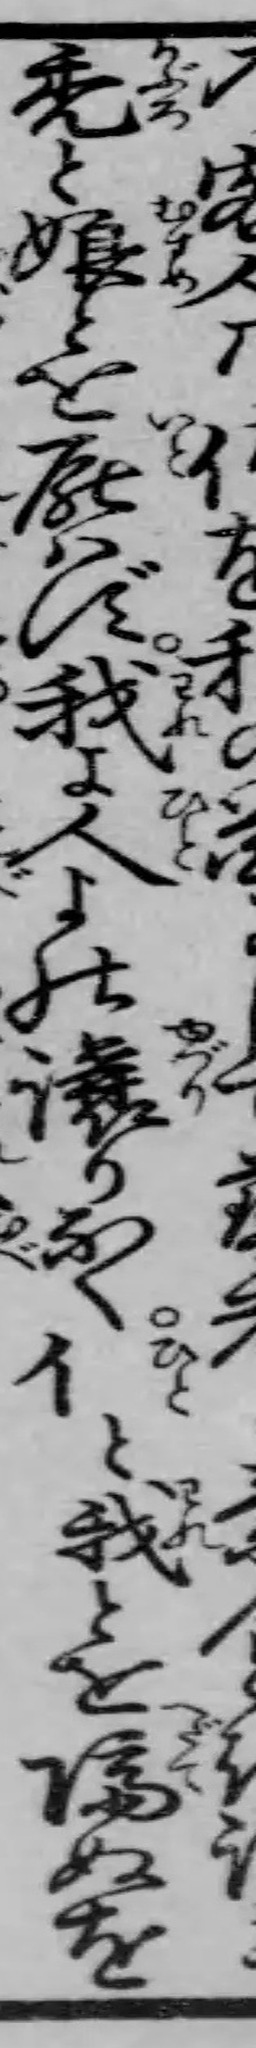禿と娘とを厭はず。我よ人よの譲りなく。イと。我とを隔ぬを
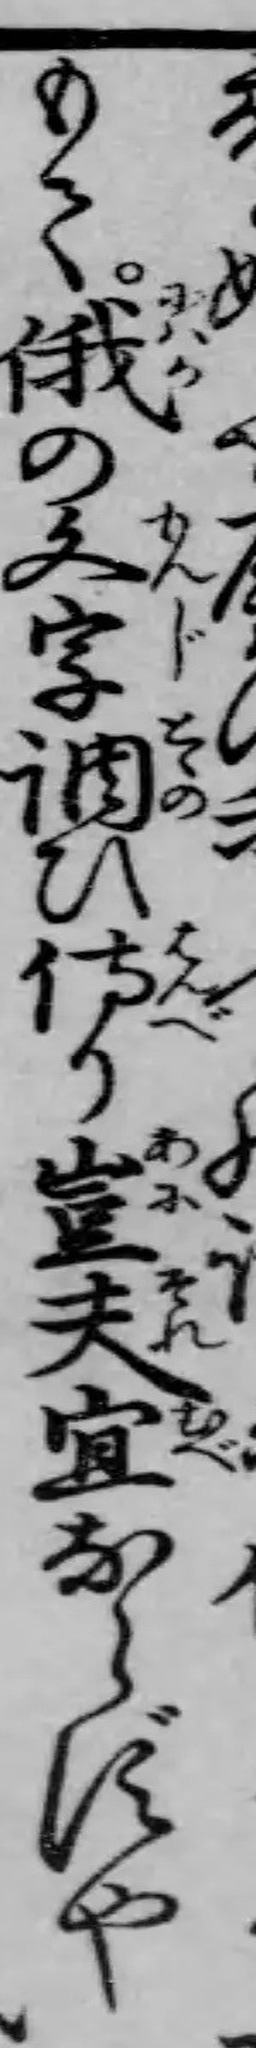もて。俄の文字調ひ侍り豈夫宜ならずや
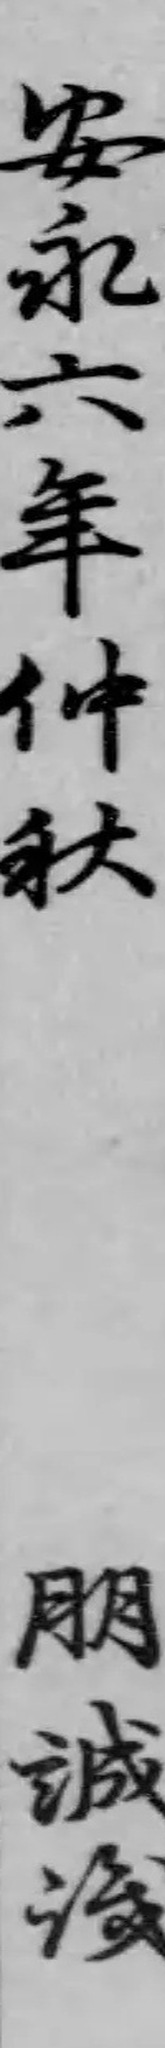安永六年仲秋朋誠識

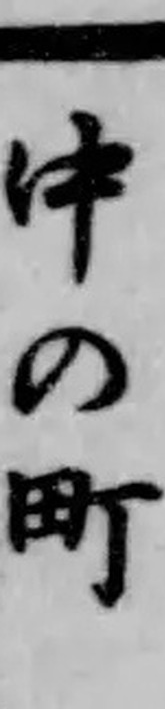中の町
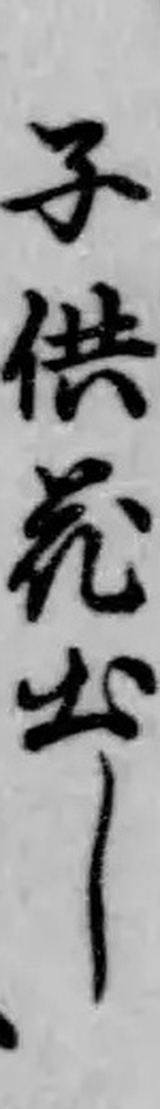子供花出し
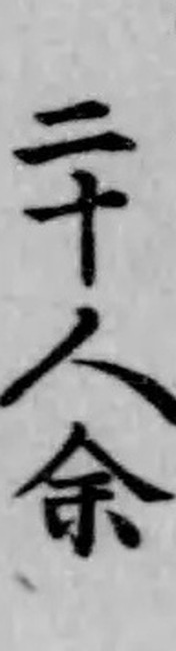二十人余
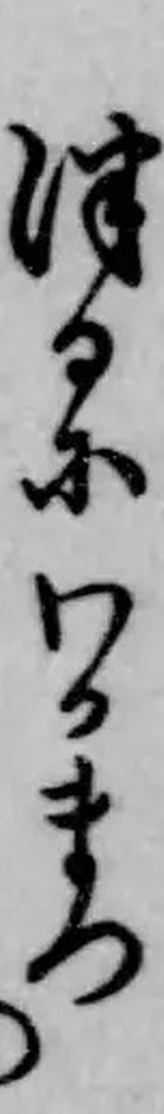つるにわかまつ
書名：明月余情. 第1編
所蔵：国立国会図書館 National Diet Library, JAPAN
